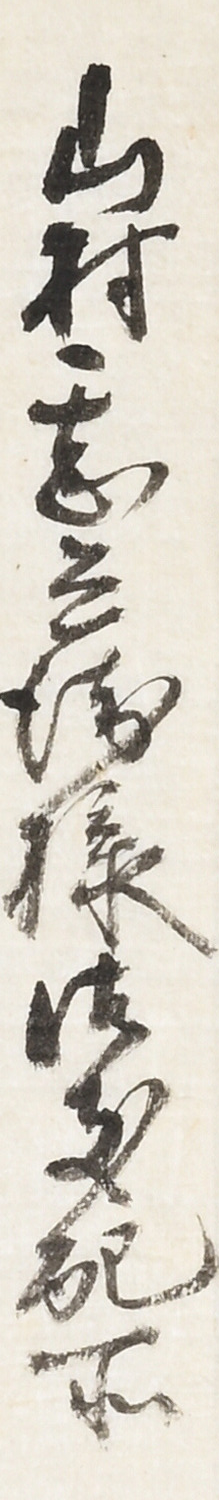山村甚兵衛様御支配所
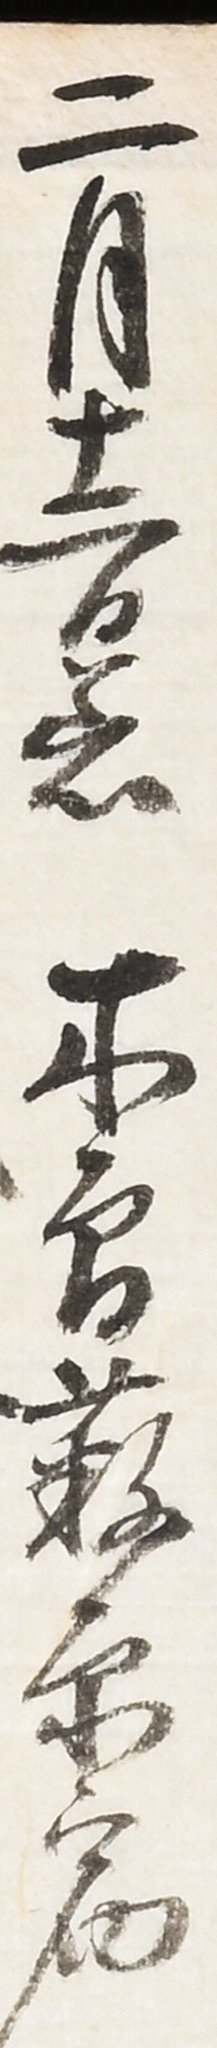二月十二日着木曽藪原宿
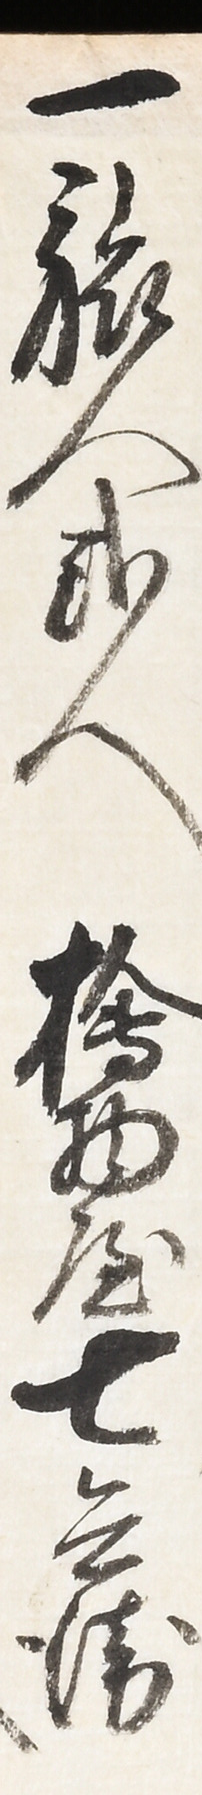一旅人弐人檜物屋七兵衛
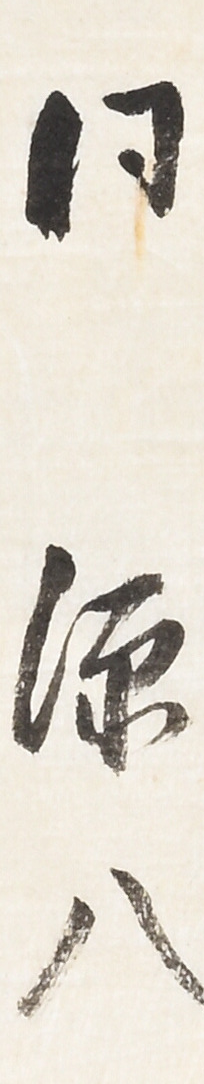同源八
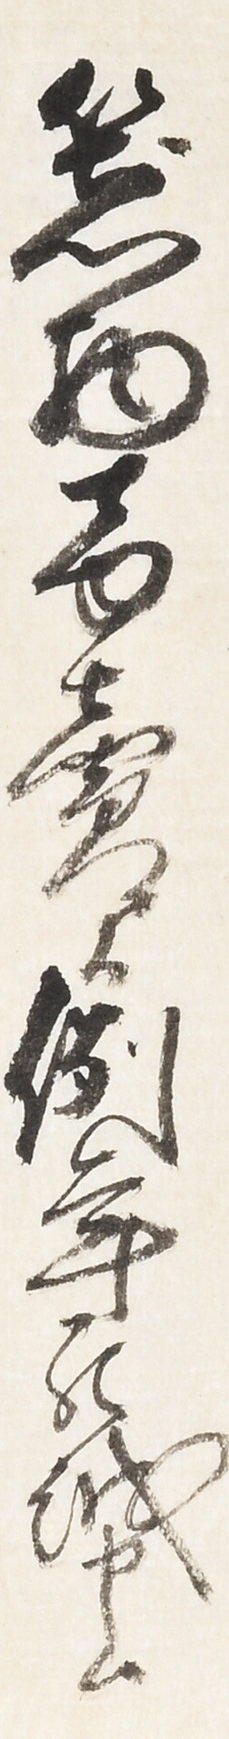器物商売ニ而例年罷越申候
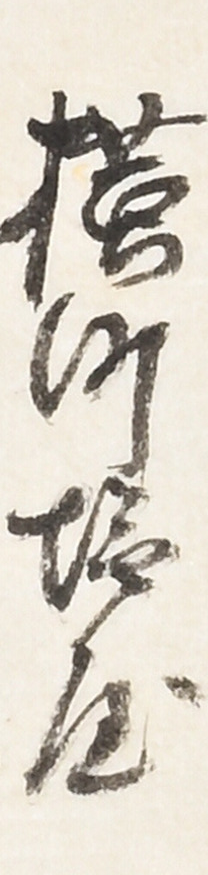横町塩屋
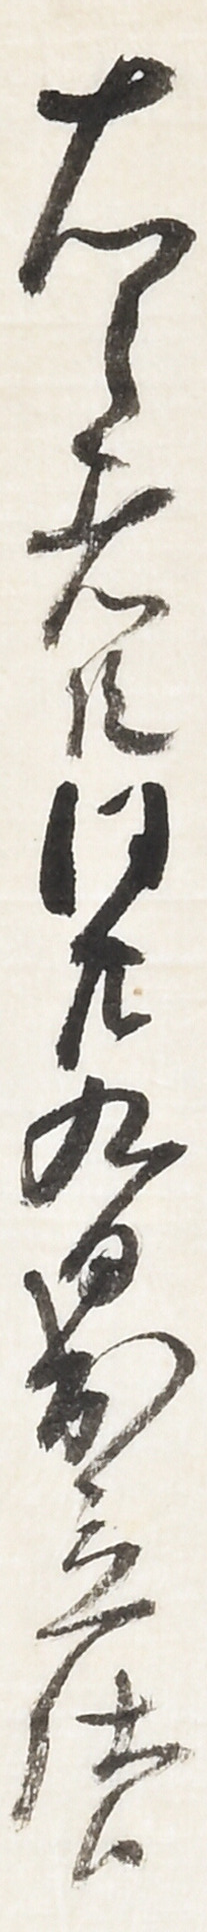右之者共同廿日出立仕候
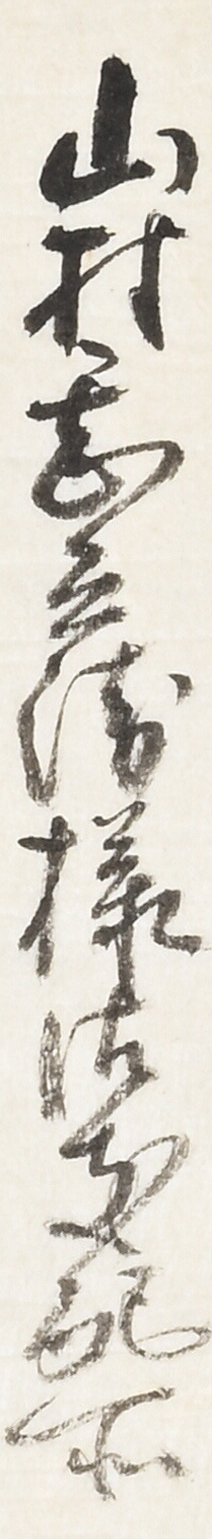山村甚兵衛様御支配所
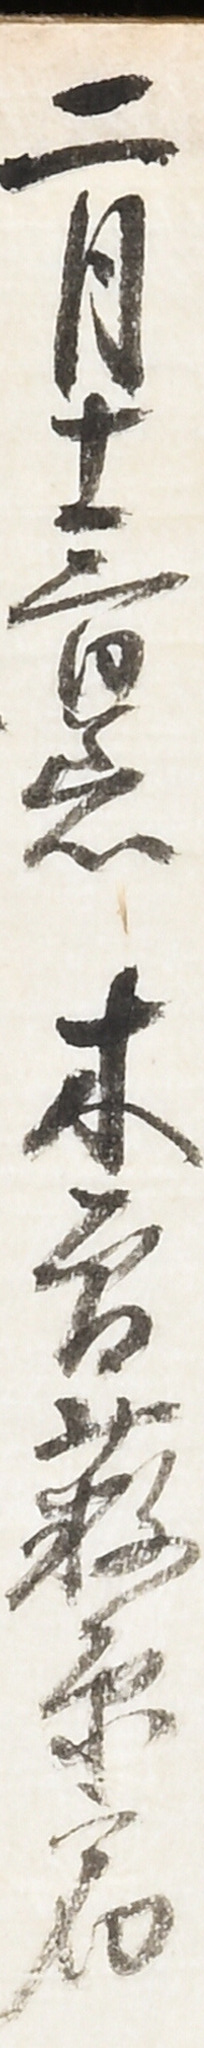二月十三日着木曽藪原宿
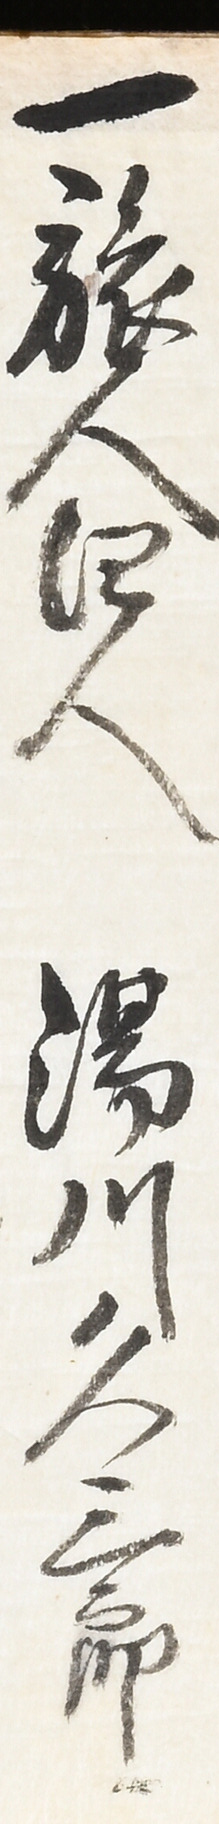一旅人四人湯川久三郎・
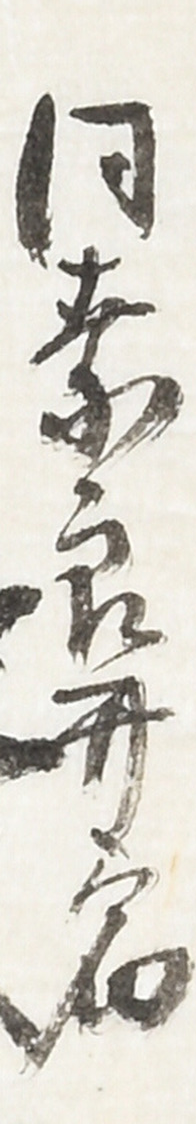同奈良井宿
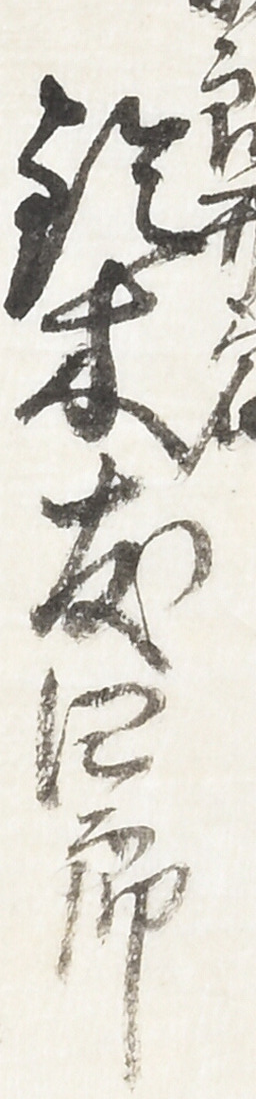鈴木友四郎
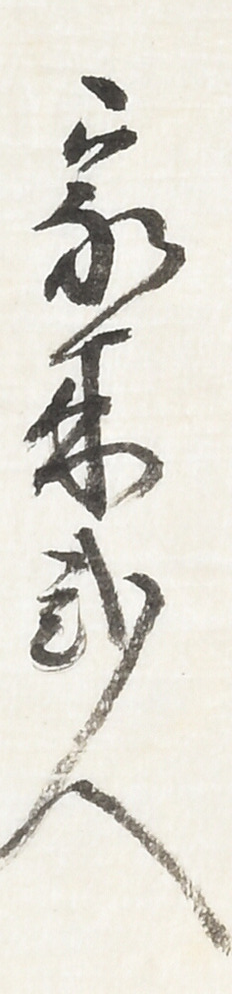家来弐人
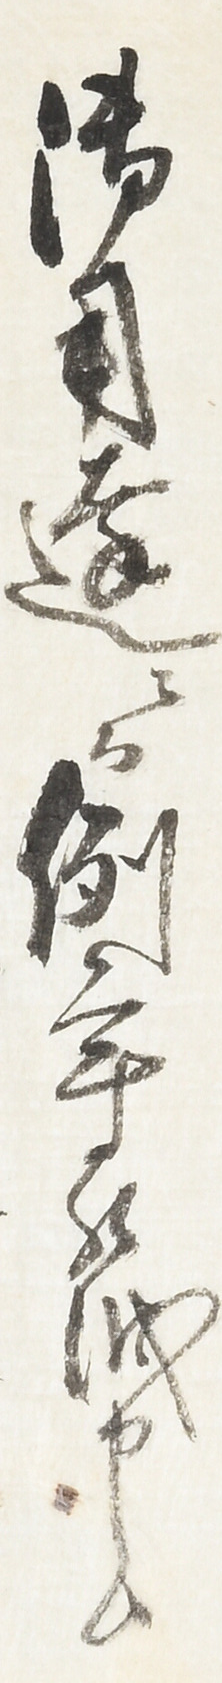御用達ニ而例年罷越申候
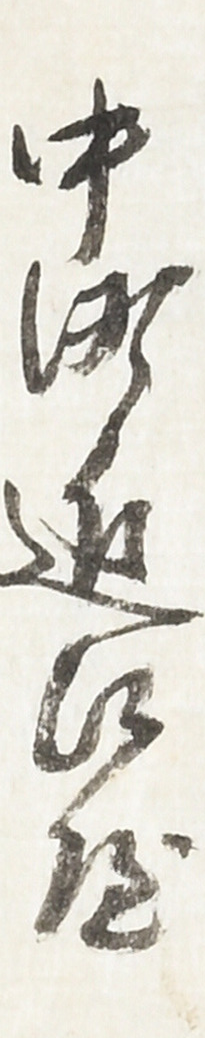中町近江屋
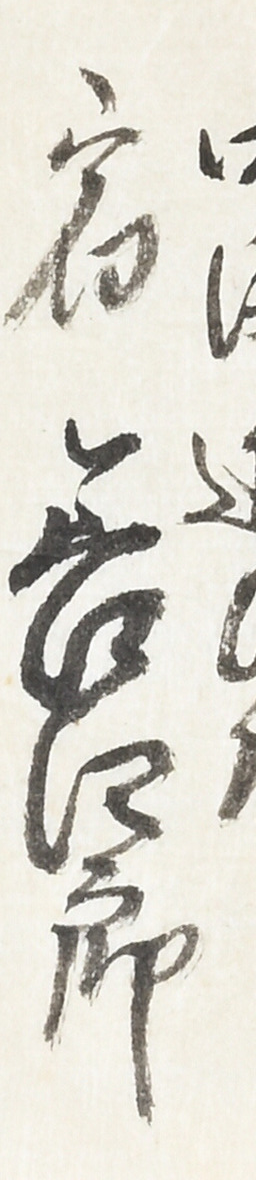宿善四郎
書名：旅人泊控帳
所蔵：伊那市立高遠町図書館・合同会社AMANE
